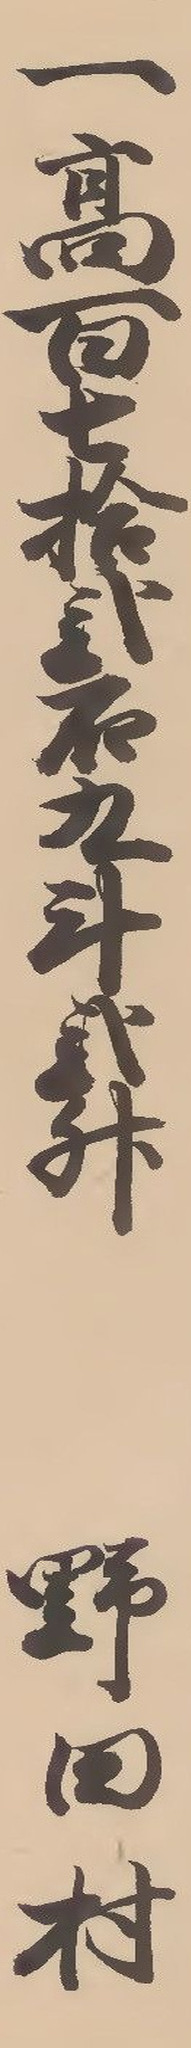一高百七拾弐石九斗弐升野田村
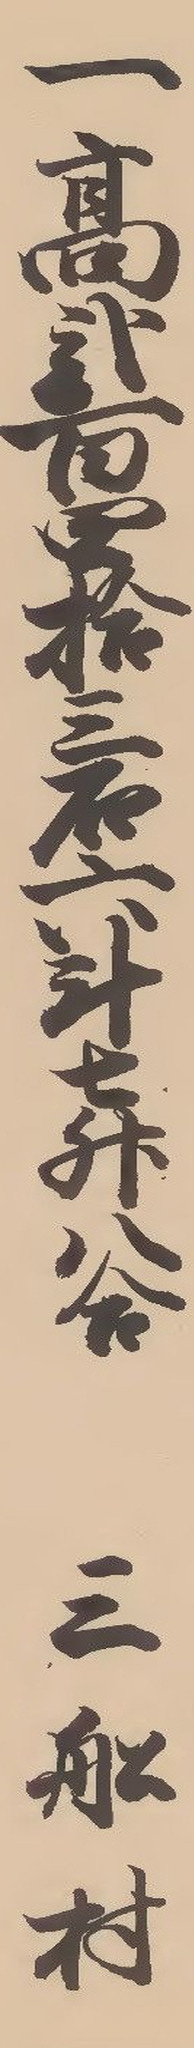一高弐百四拾三石六斗七升八合三船村
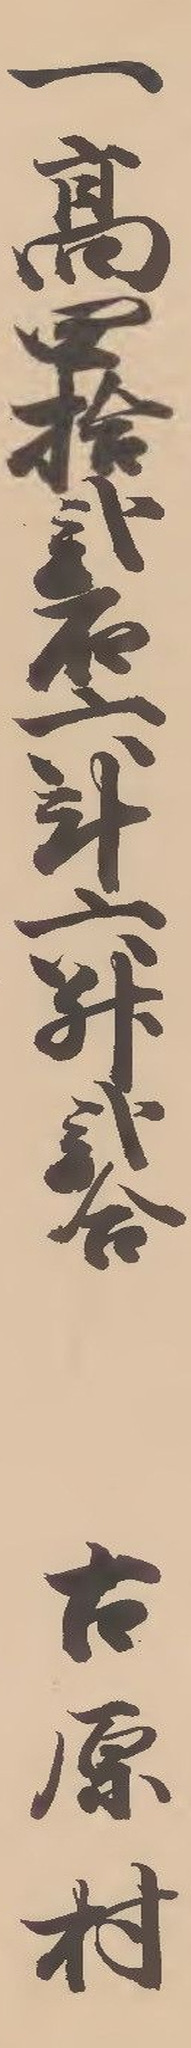一高四拾弐石六斗六升弐合古原村
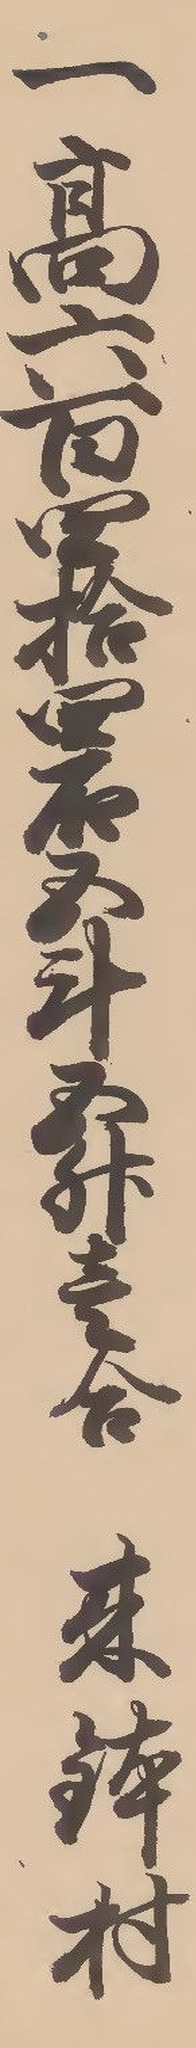一高六百四拾四石五斗五升壱合来鉢村

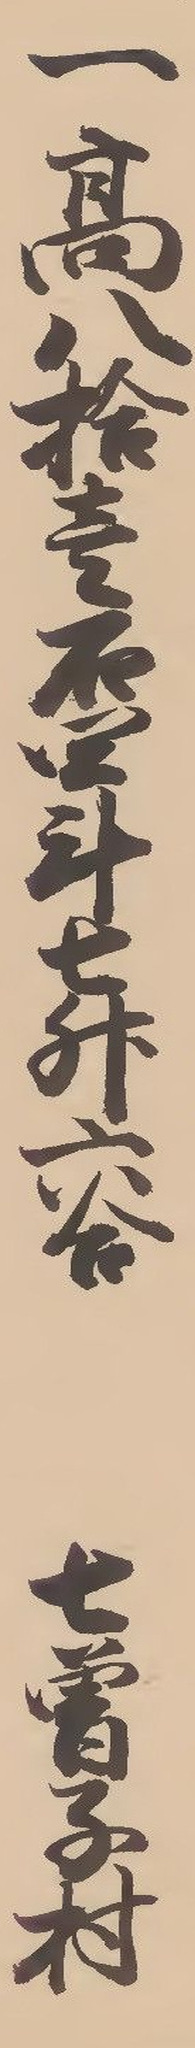一高八拾壱石四斗七升六合七曽子村
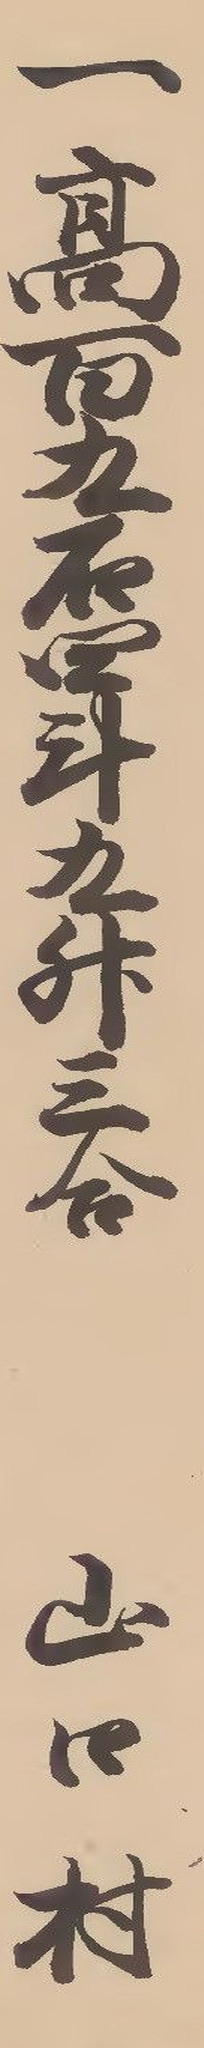一高百九石四斗九升三合山口村
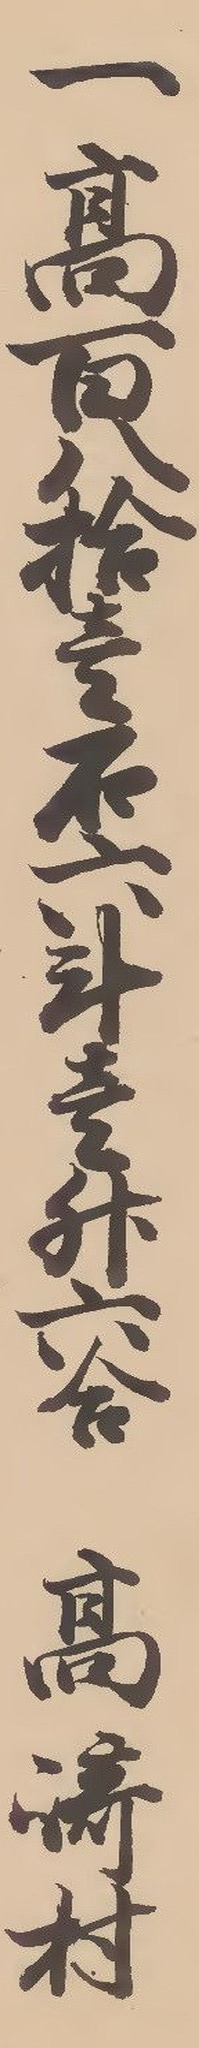一高百八拾壱石六斗壱升六合高崎村
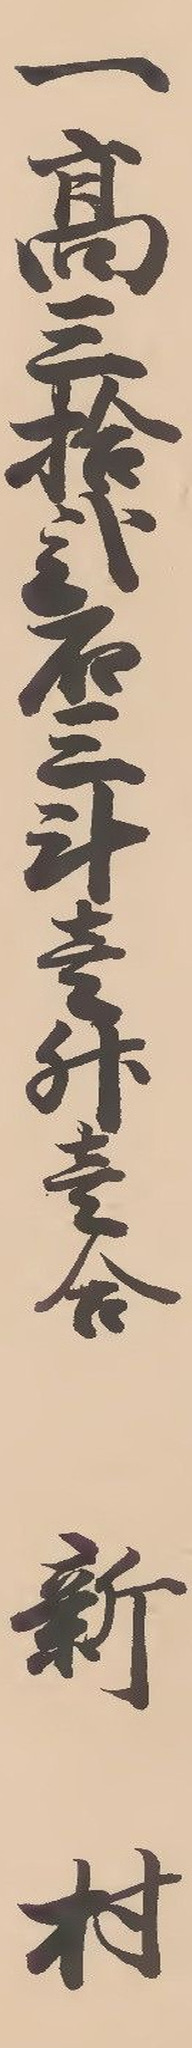一高三拾弐石三斗壱升壱合新村
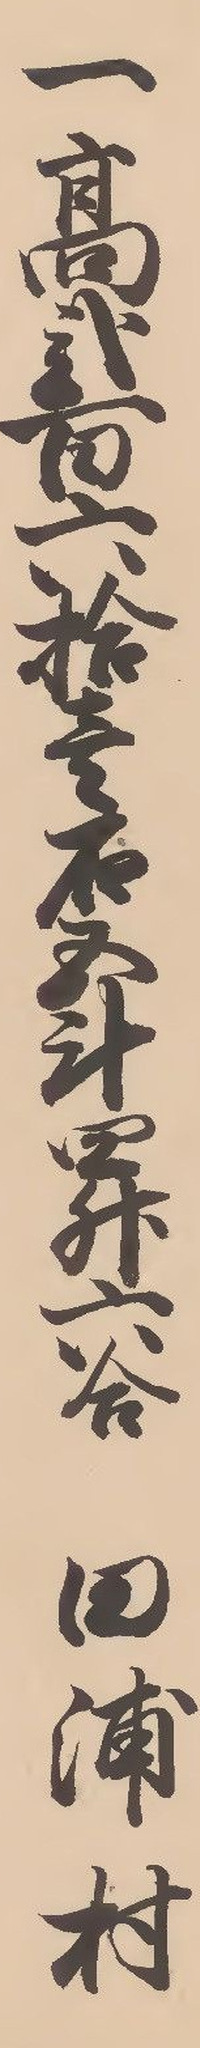一高弐百六拾壱石五斗四升六合田浦村
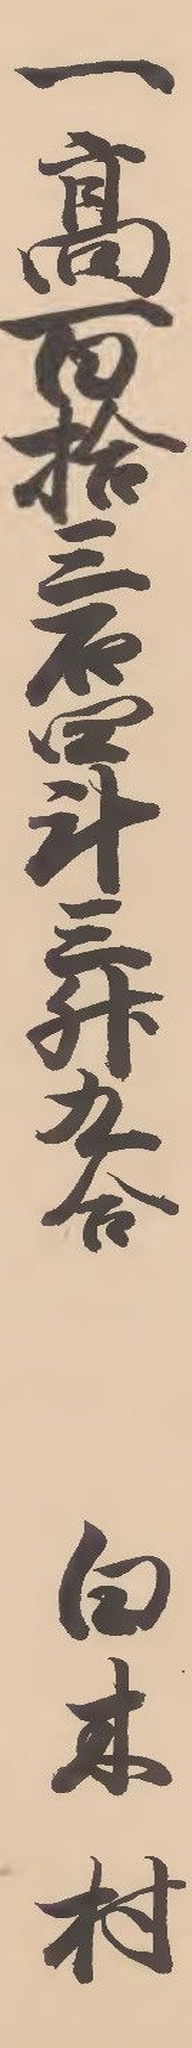一高百拾三石四斗三升九合白木村
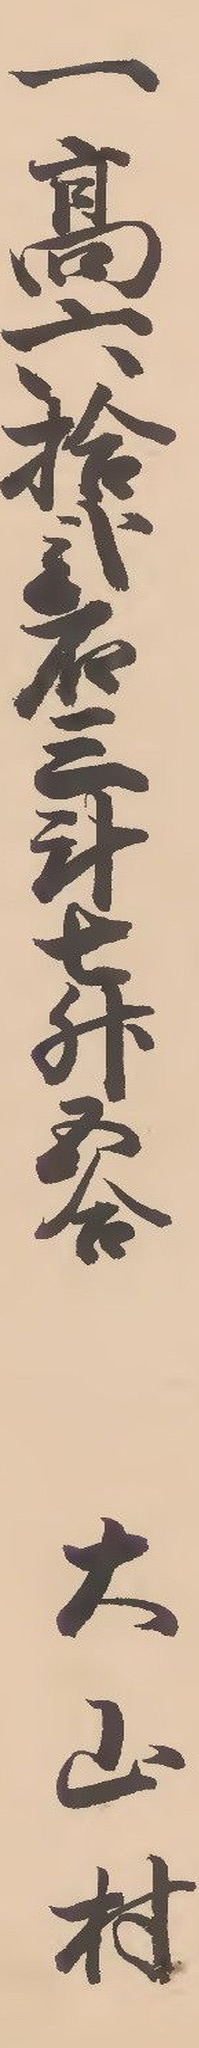一高六拾弐石三斗七升五合大山村

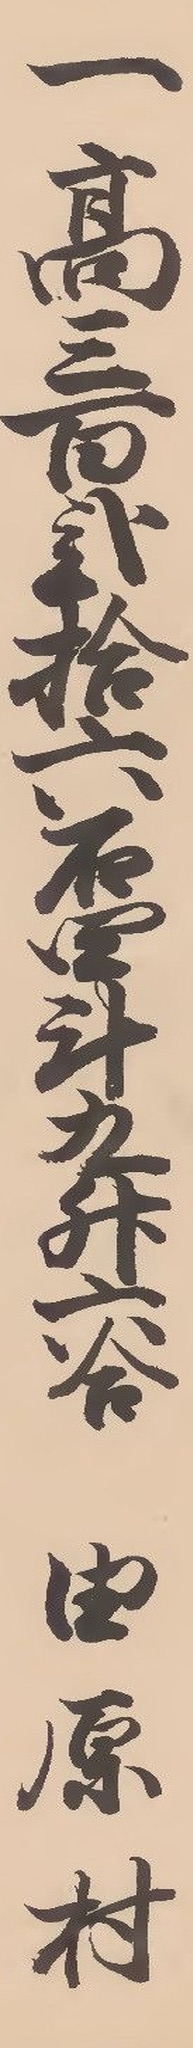一高三百弐拾六石四斗九升六合由原村
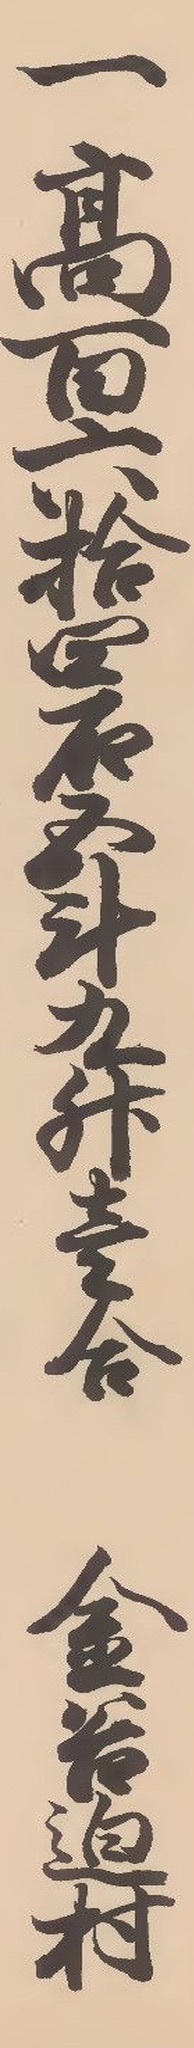一高百六拾四石五斗九升壱合金谷迫村
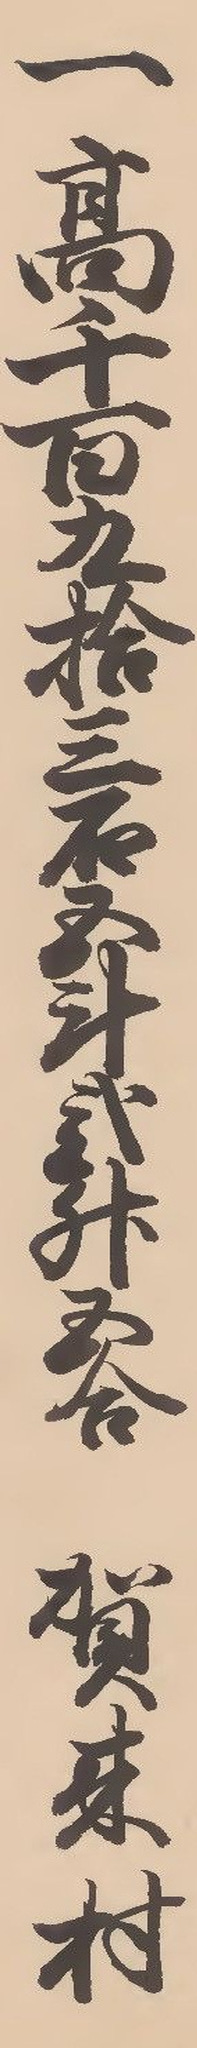一高千百九拾三石五斗弐升五合賀来村
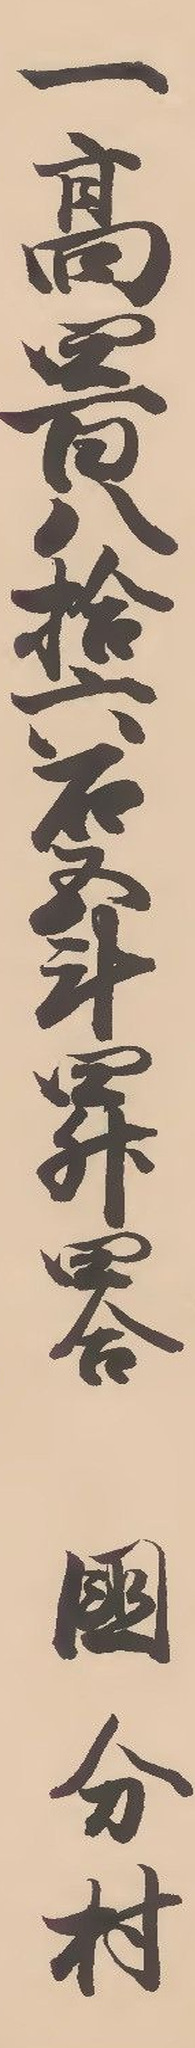一高四百八拾六石五斗四升四合国分村
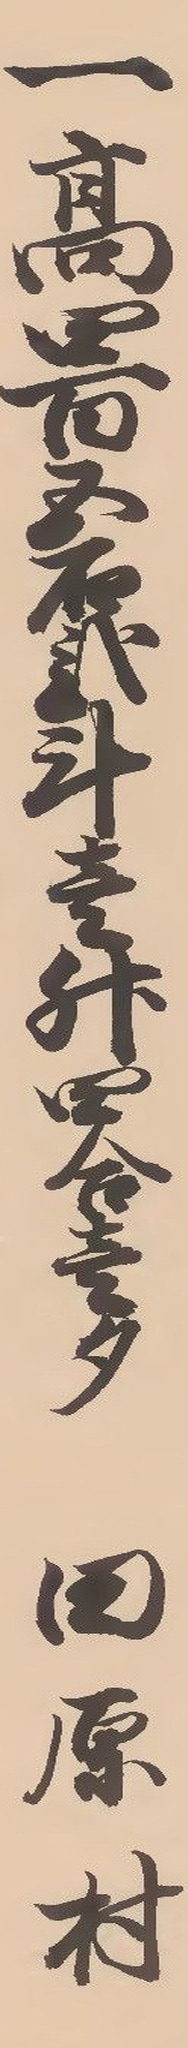一高四百五石弐斗壱升四合壱勺田原村
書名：豊後国郷帳
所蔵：国立公文書館 National Archives of Japan
